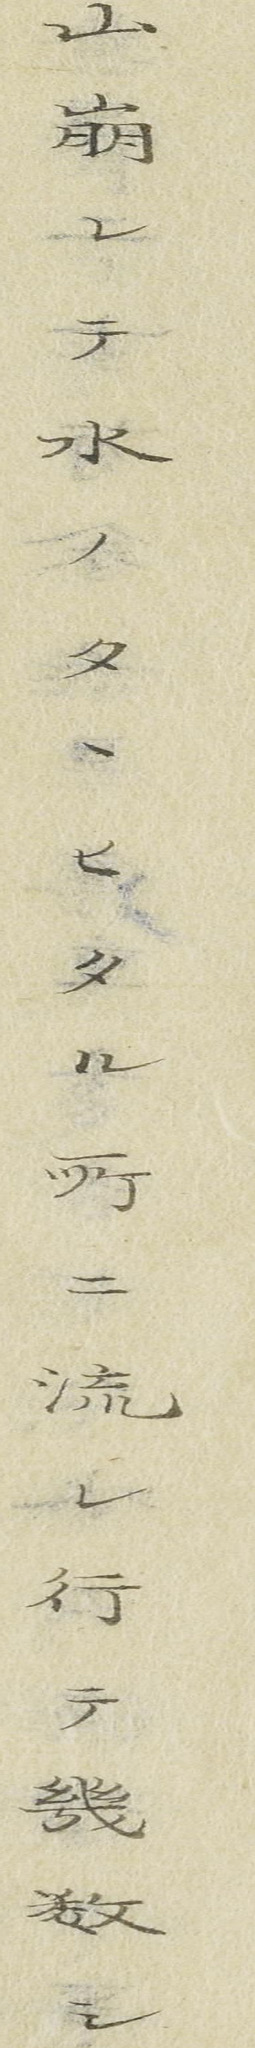山崩レテ水ノタヽヒタル所ニ流レ行テ幾数シ
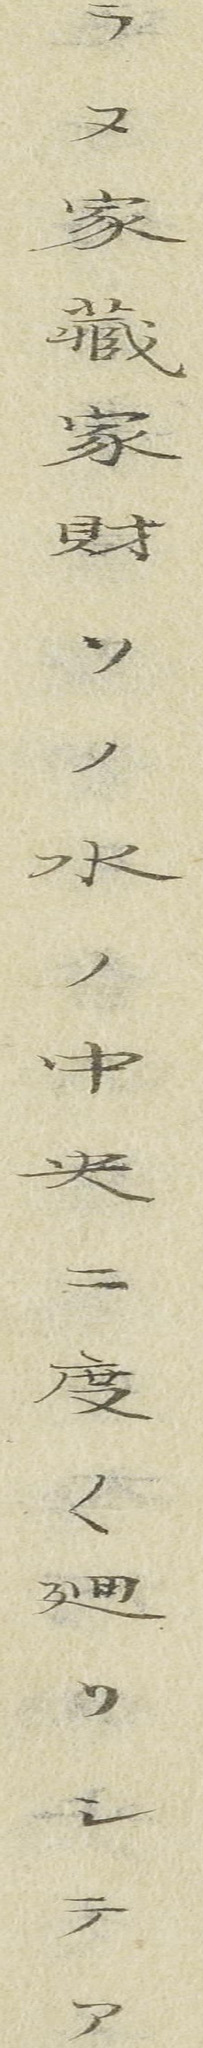ラヌ家蔵家財ソノ水ノ中央ニ度〱廻リシテア

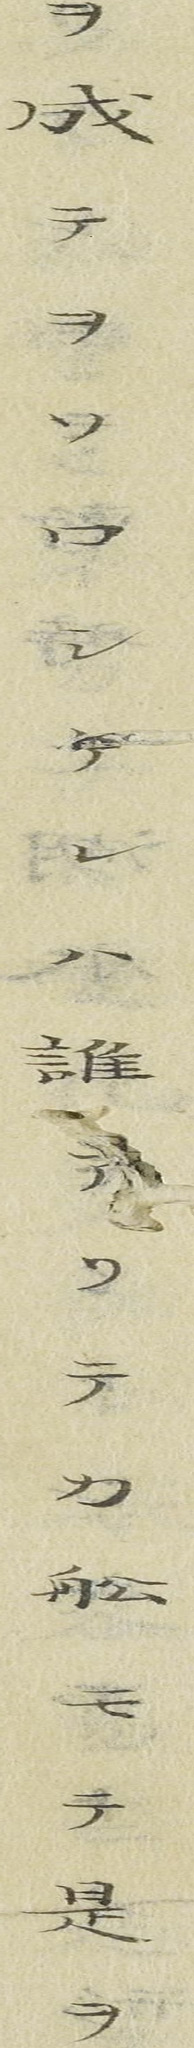ヲ成テヲソロシケレハ誰アリテカ船モテ是ヲ
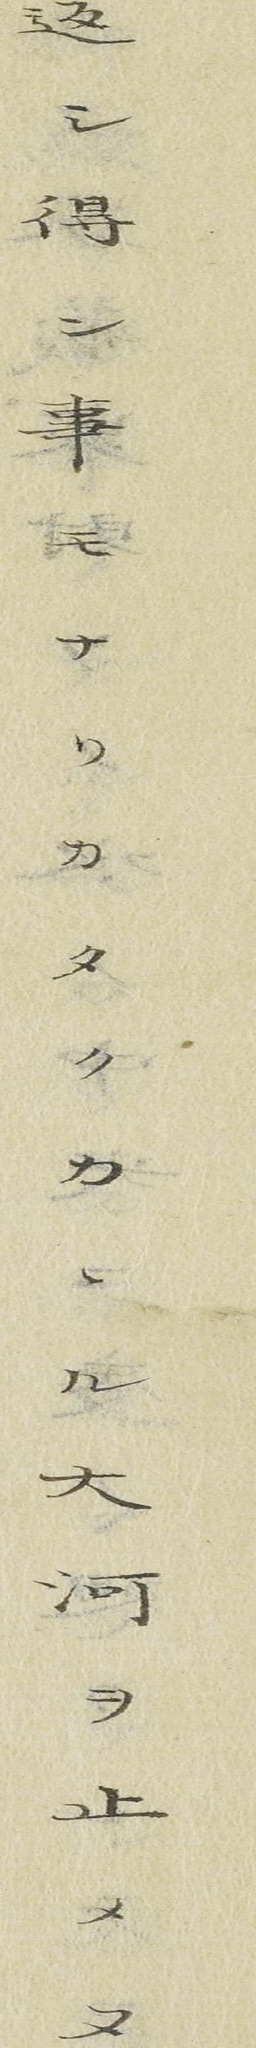返シ得ン事モアリカタクカヽル大河ヲ止メヌ
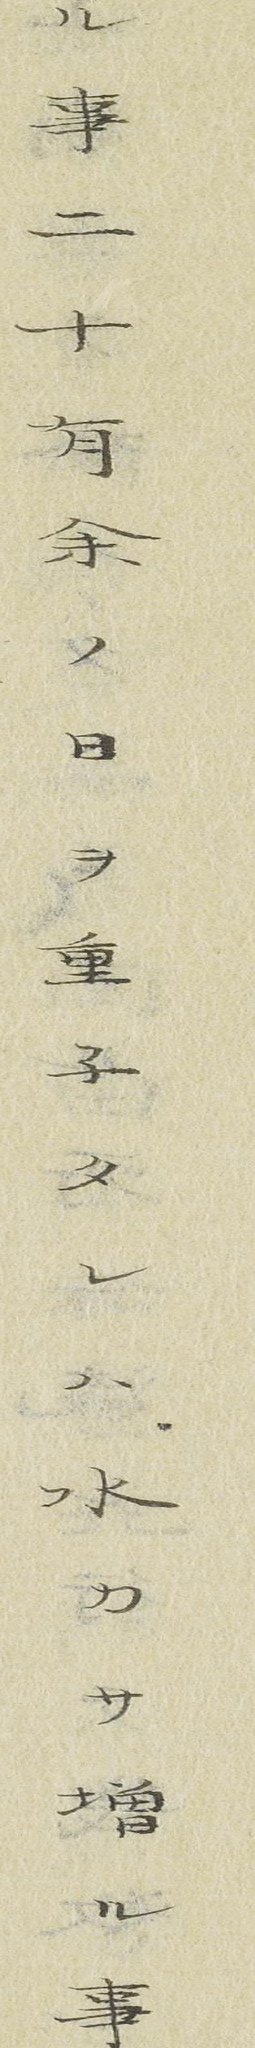ル事二十有余ノ日ヲ重子タレハ水カサ増ル事
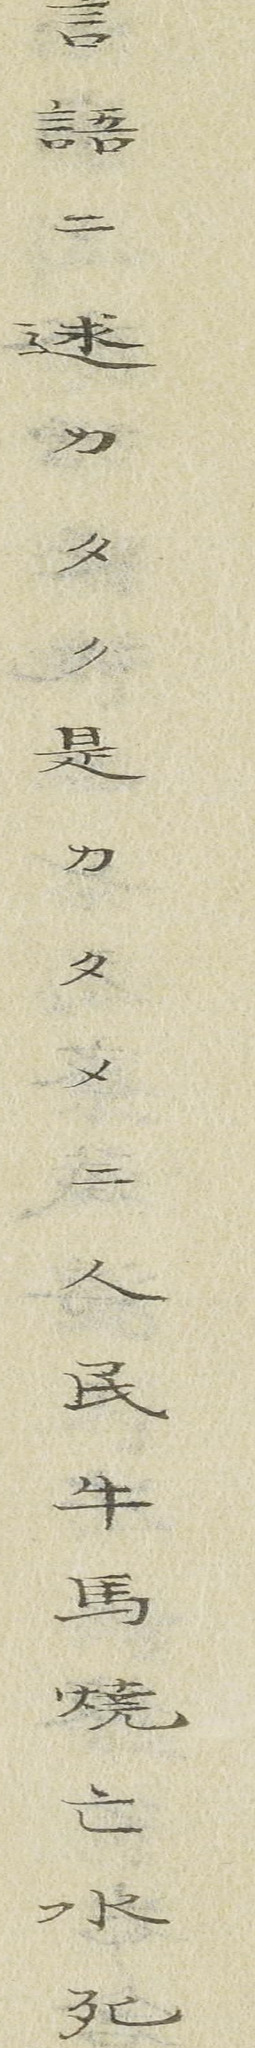言語ニ述カタク是カタメニ人民牛馬焼亡水死
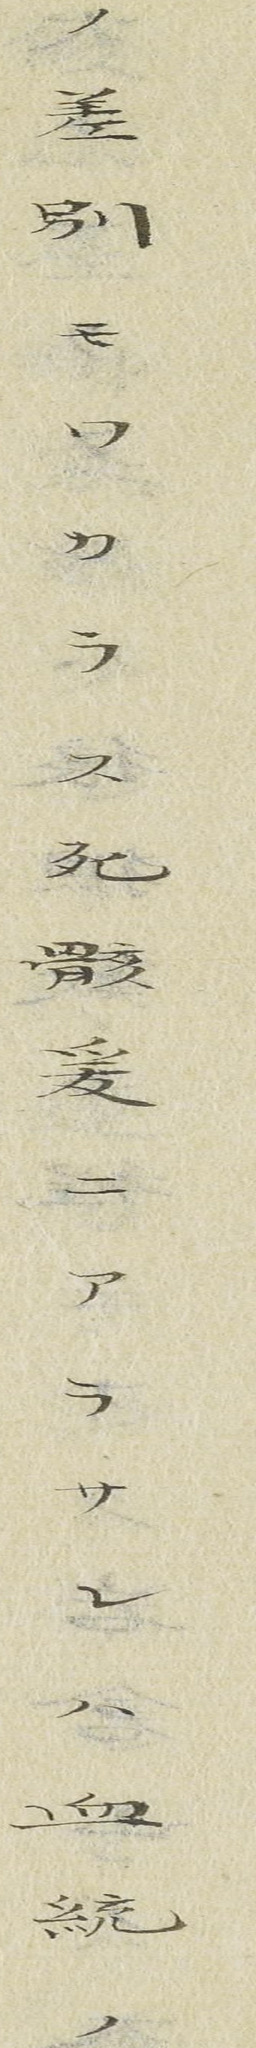ノ差別モワカラス死骸爰ニアラサレハ血統ノ
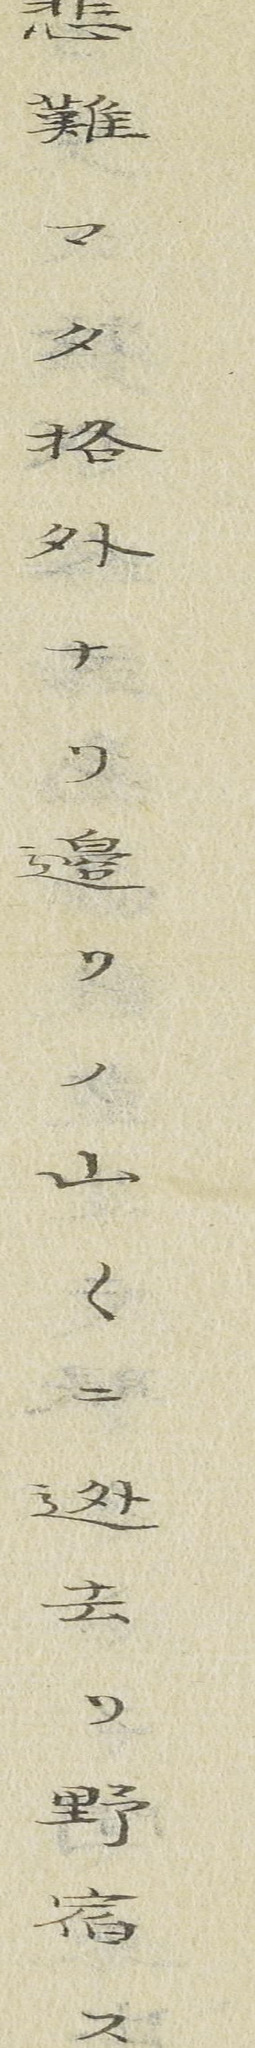悲難マタ格別ナリ辺リノ山〱ニ逃去リ野宿ス
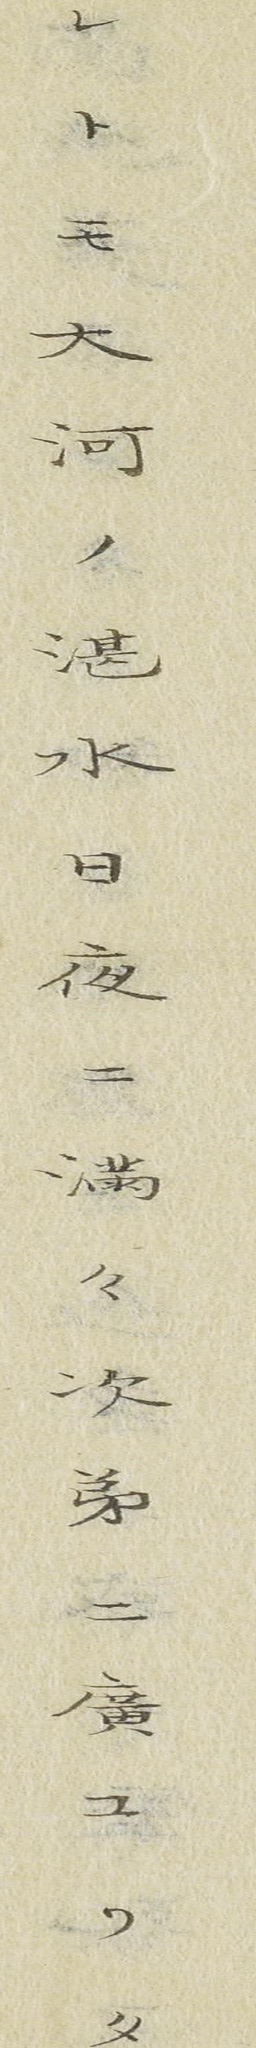レトモ大河ノ湛水日夜ニ満々次第ニ広ユリタ
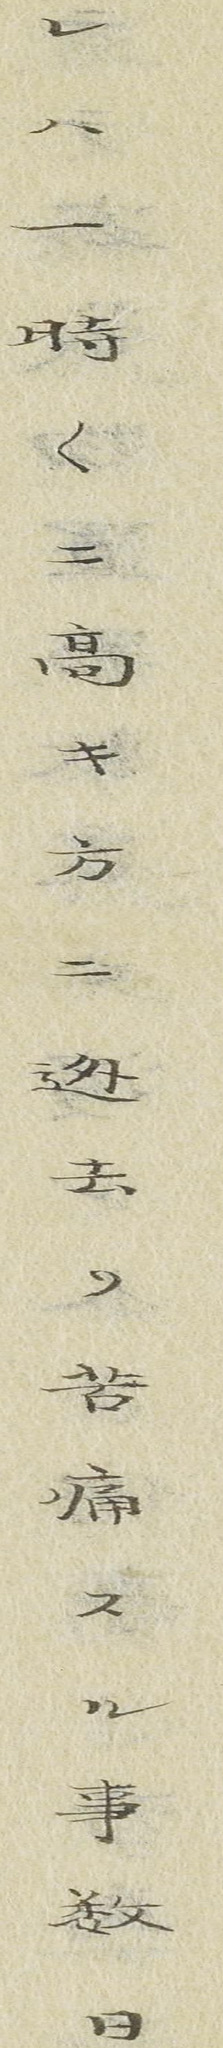レハ一時〱ニ高キ方ニ逃去リ苦痛スル事数日
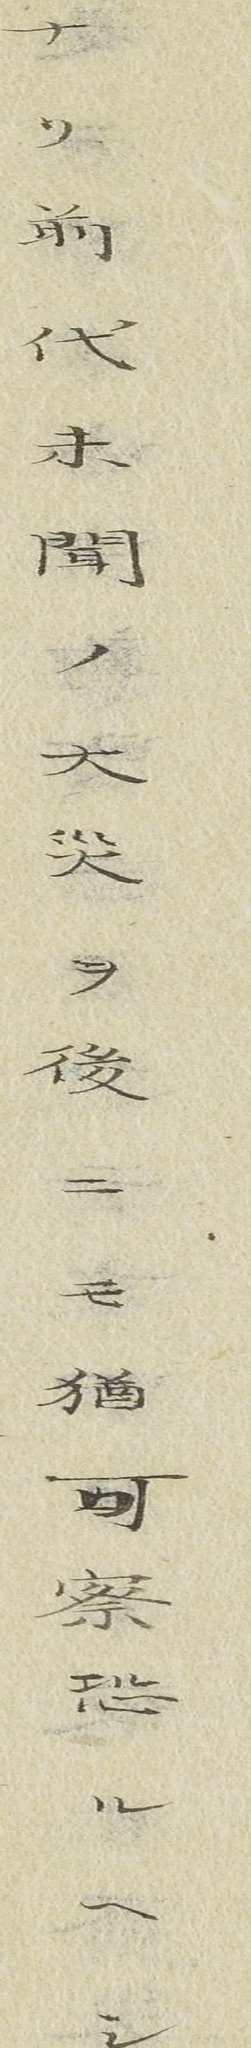ナリ前代未聞ノ大災ヲ後ニモ猶可察恐ルヘシ
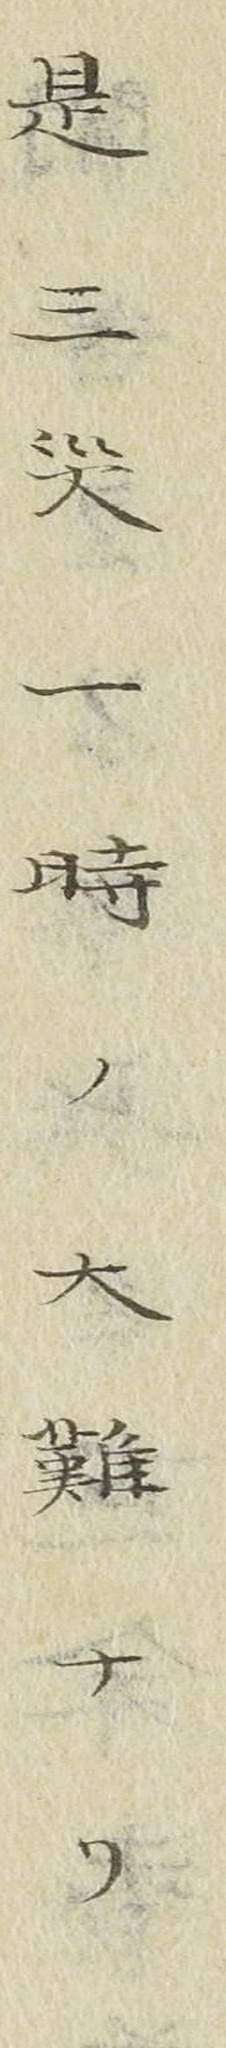是三災一時ノ大難ナリ
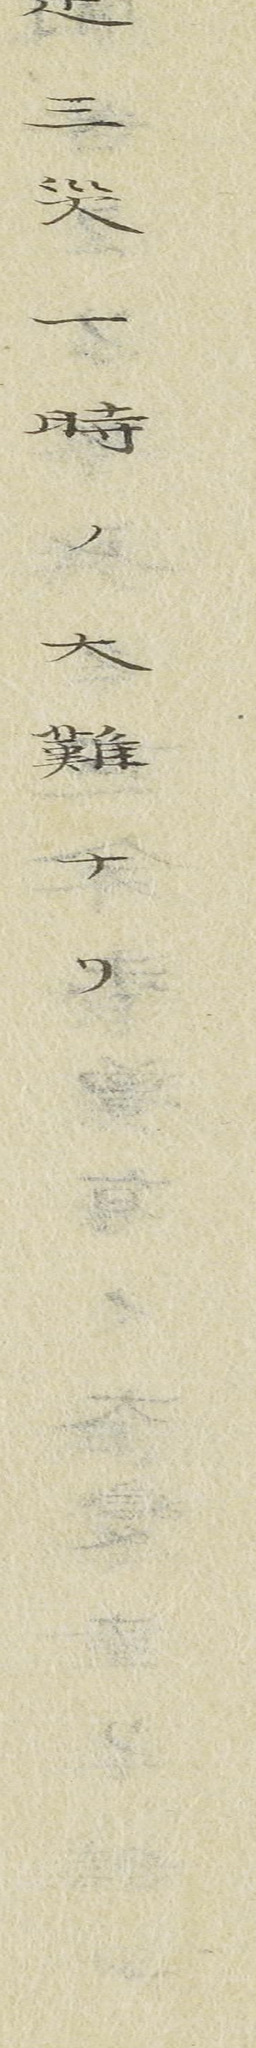是三災一時ノ大難ナリ
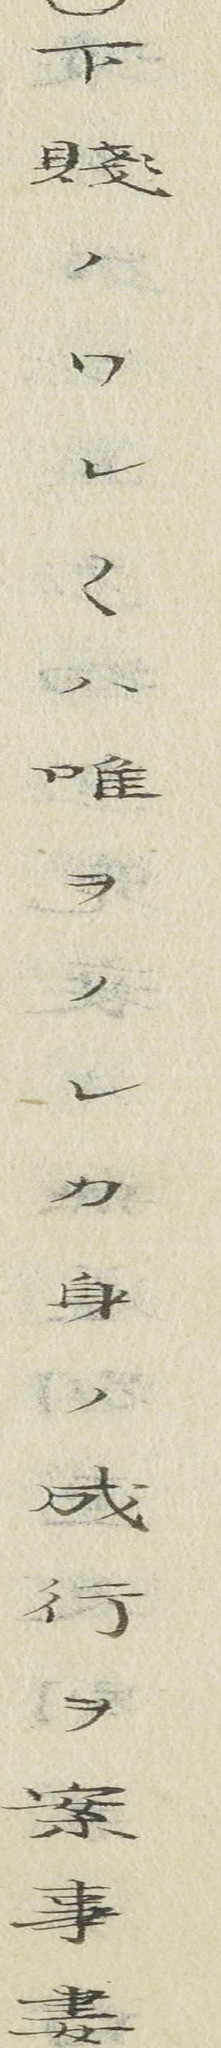〇下賤ノワレ〱ハ唯ヲノレカ身ノ成行ヲ案事妻
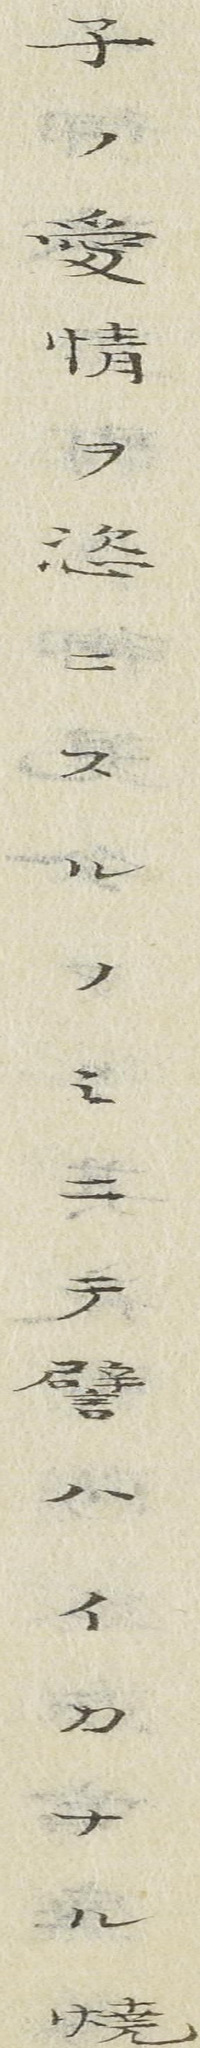子ノ愛情ヲ恣ニスルノミニテ譬ハイカナル焼
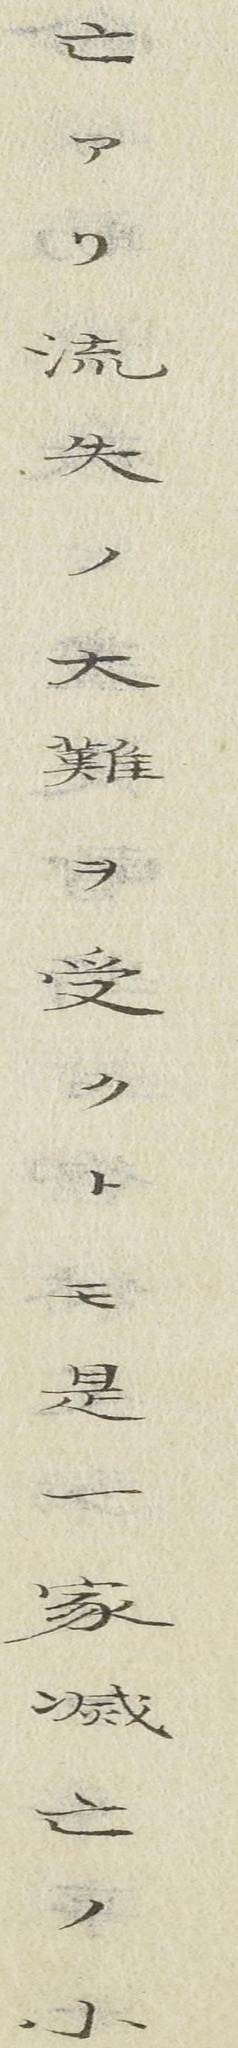亡アリ流失ノ大難ヲ受クトモ是一家滅亡ノ小
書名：地災撮要　地震之部　巻ノ二
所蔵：東京大学地震研究所図書室 Earthquake Research Institute Library, The University of Tokyo, JAPAN
